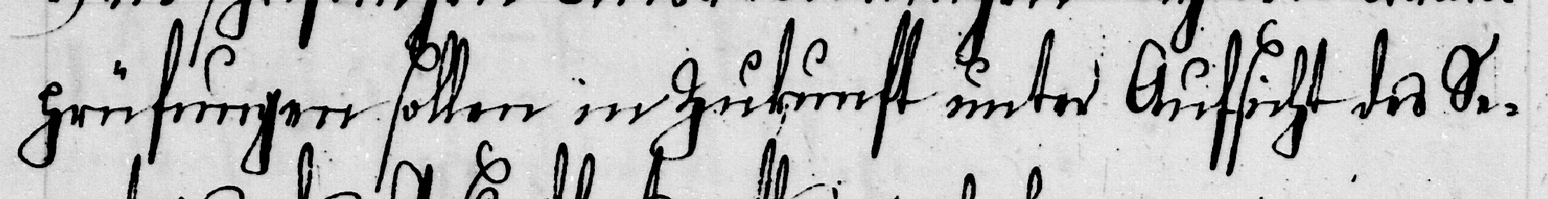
prüfungen sollen in Zukunft unter Aufsicht des Se¬
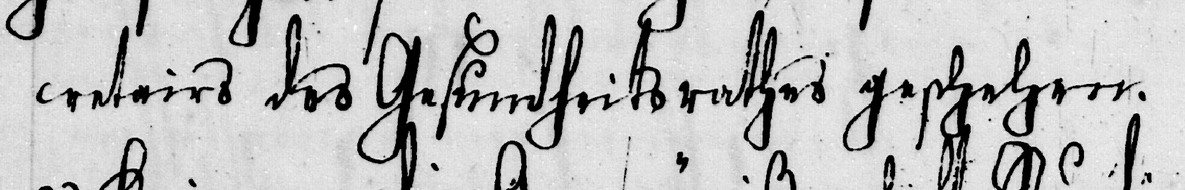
cretairs des Gesundheitsrathes geschehen.
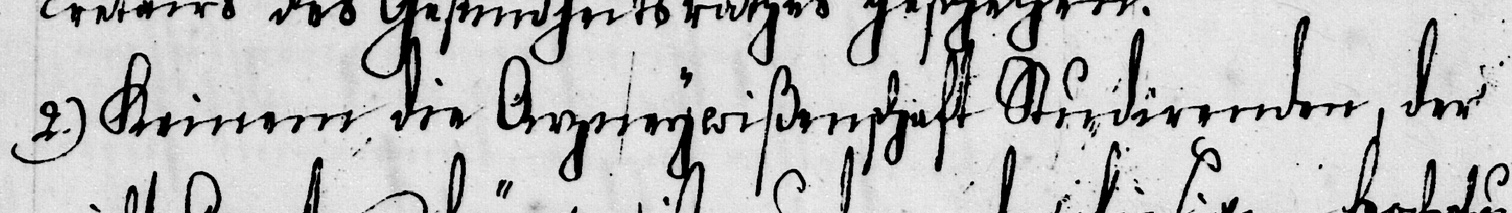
2.) Keinem die Arzneywißenschaft Studirenden, der
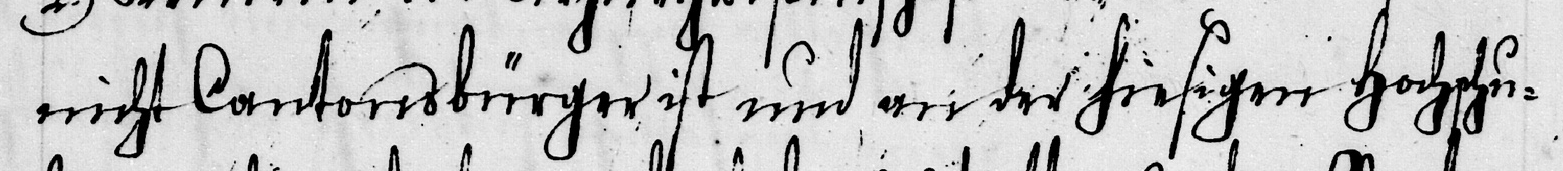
nicht Cantonsbürger ist und an der hiesigen Hochschu¬
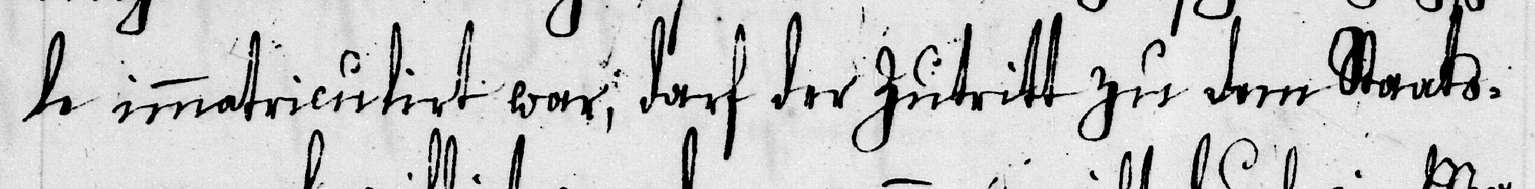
le immatriculirt war, darf der Zutritt zu dem Staats¬
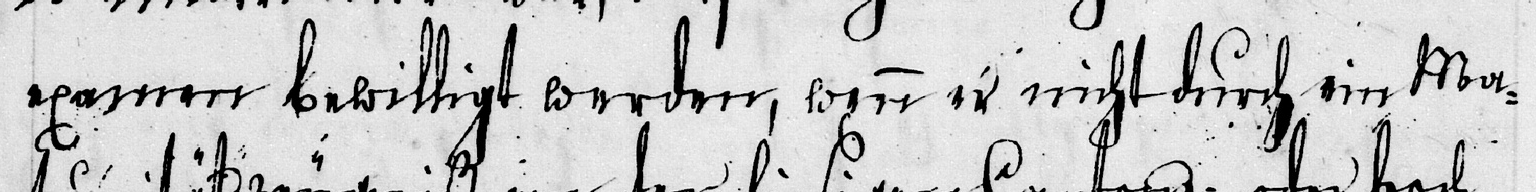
examen bewilligt werden, wenn er nicht durch ein Ma¬
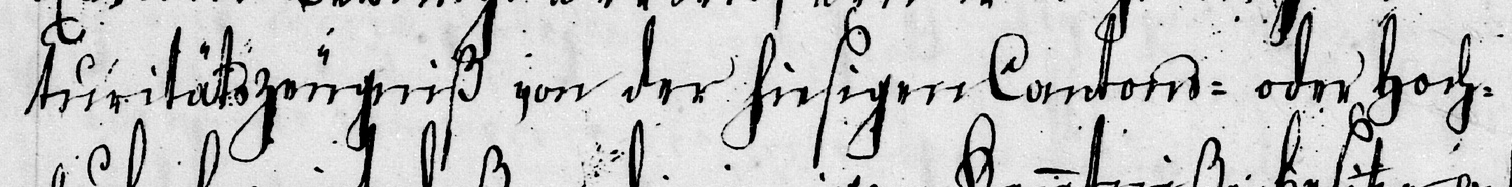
turitätszeugniß von der hiesigen Cantons- oder Hoch¬
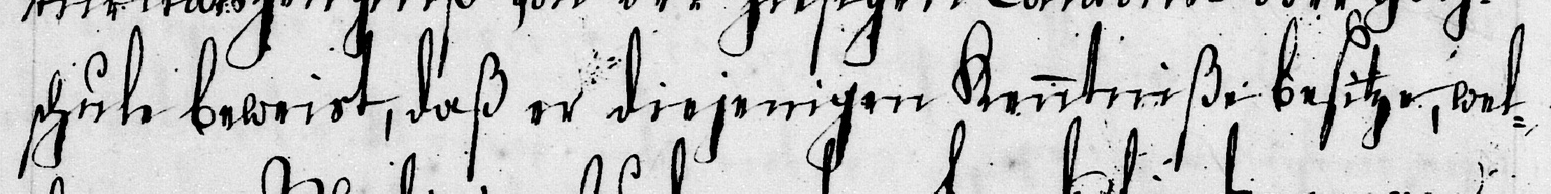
schule beweist, daß er diejenigen Kenntniße besitze, we¬
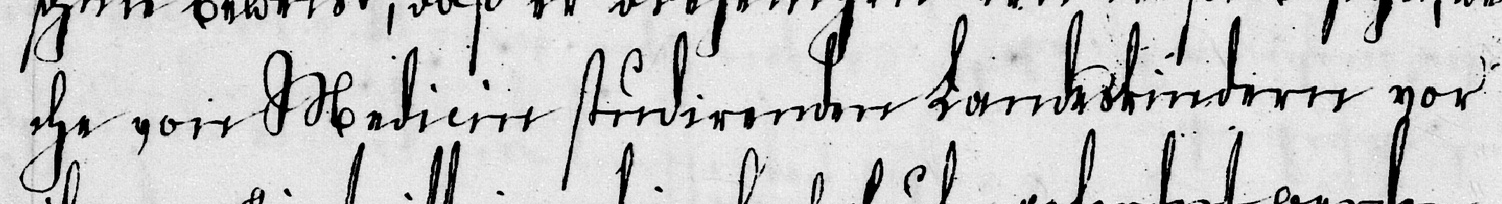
lche von Medicin studirenden Landskindern vor
